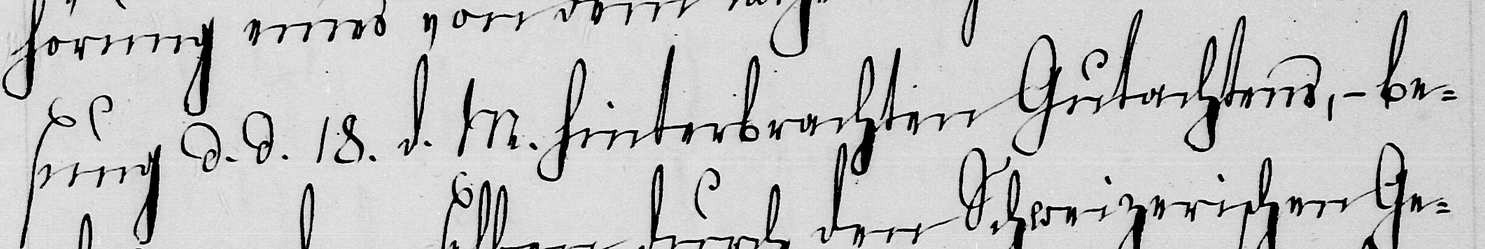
sung d. d. 18. d. M. hinterbrachten Gutachtens, – be¬
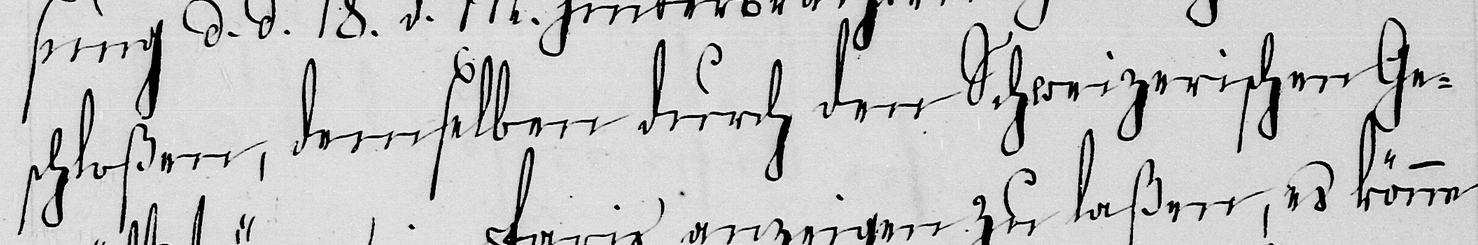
schloßen, demselben durch den Schweizerischen Ge¬
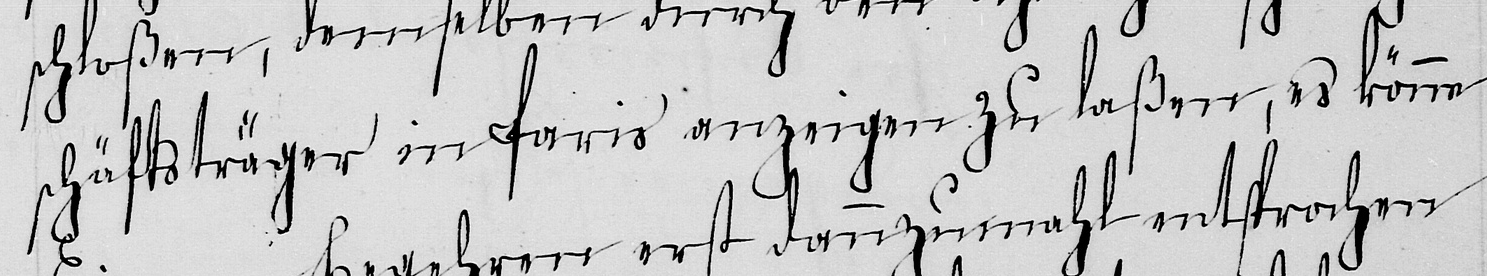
schäftsträger in Paris anzeigen zu laßen, es könne
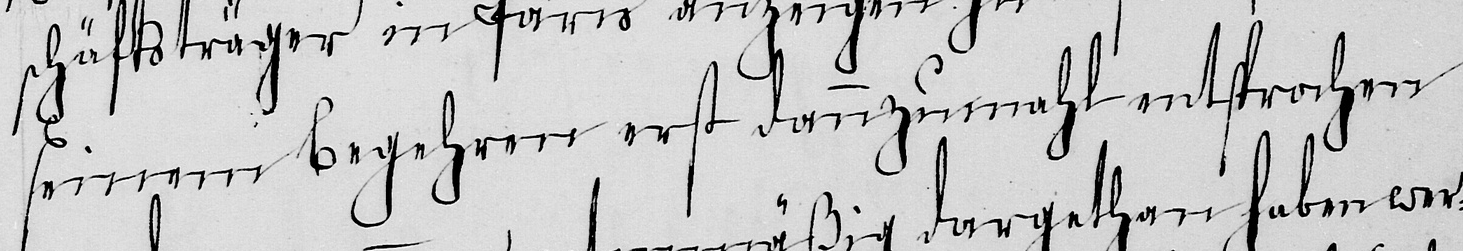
seinem Begehren erst dannzumahl entsprochen
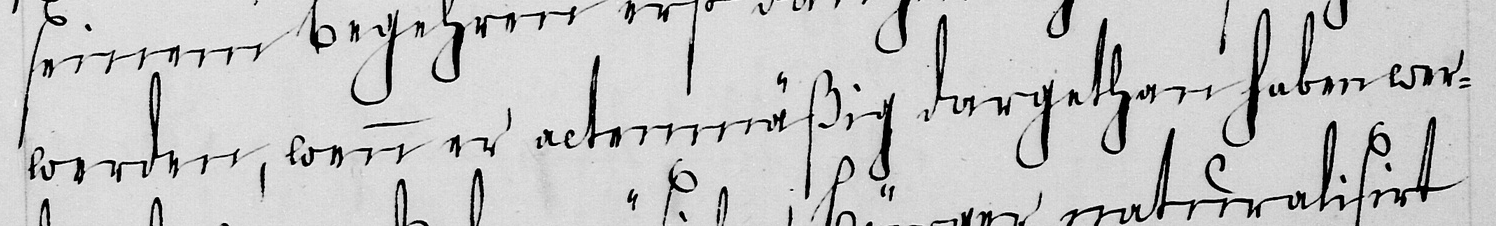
werden, wenn er actenmäßig dargethan haben wer¬
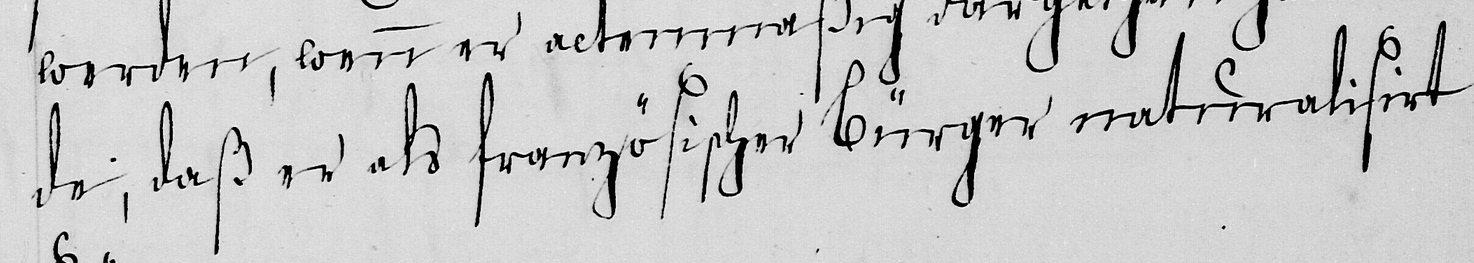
de, daß er als französischer Bürger naturalisirt
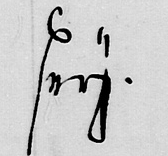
sey.
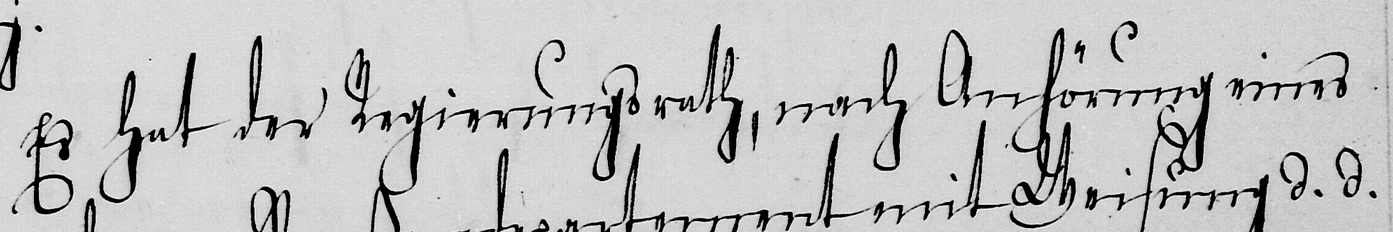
Es hat der Regierungsrath, nach Anhörung eines
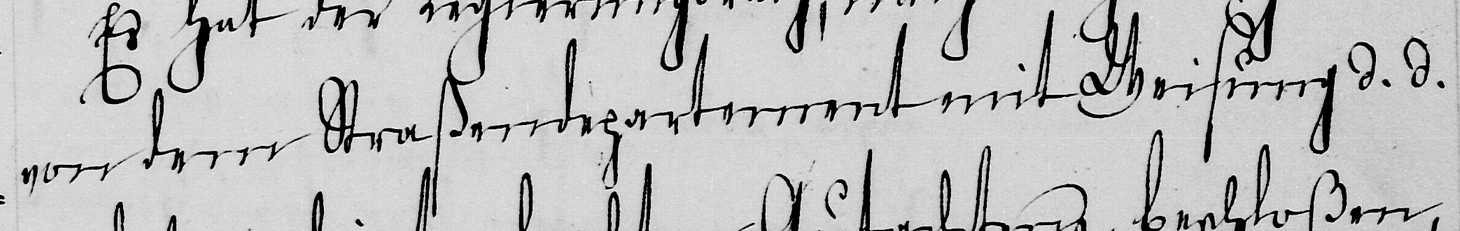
von dem Straßendepartement mit Weisung d. d.
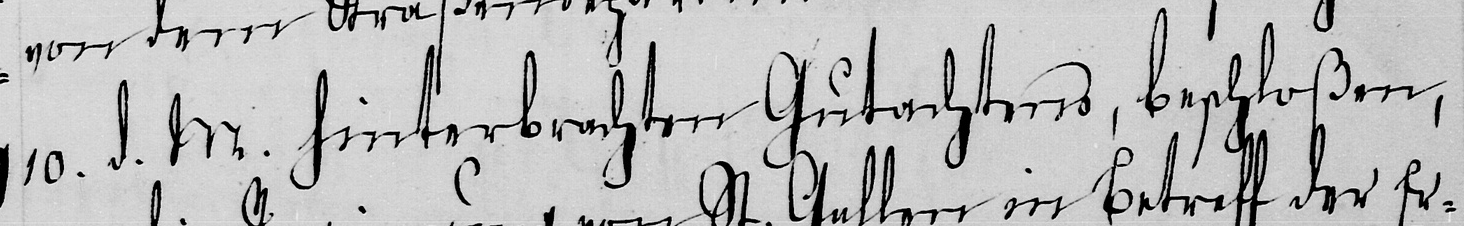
10. d. M. hinterbrachten Gutachtens, beschloßen,
